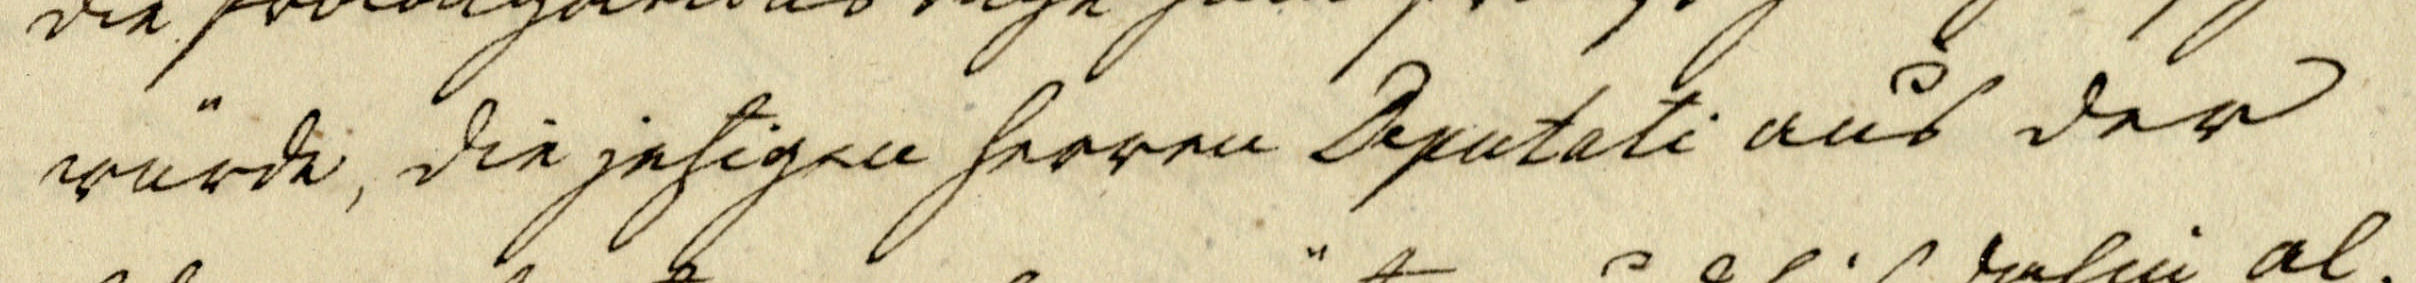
würde, die jetzigen Herren Deputati aus der
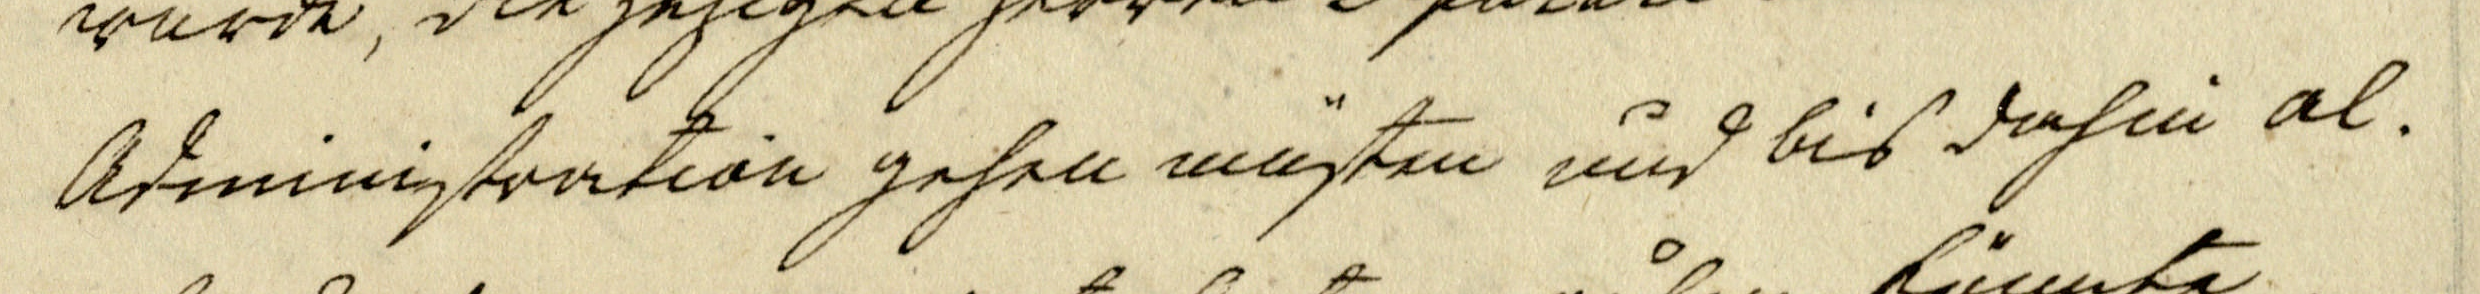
Administration gehen müßten und bis dahin al¬
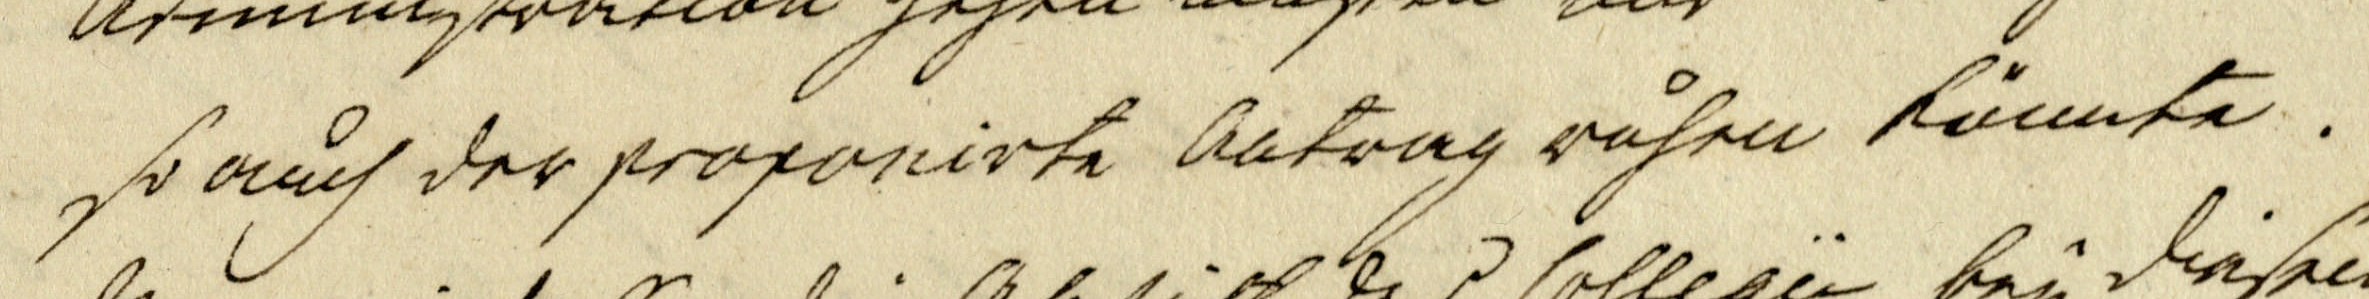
so auch der proponirte Antrag ruhen könnte.
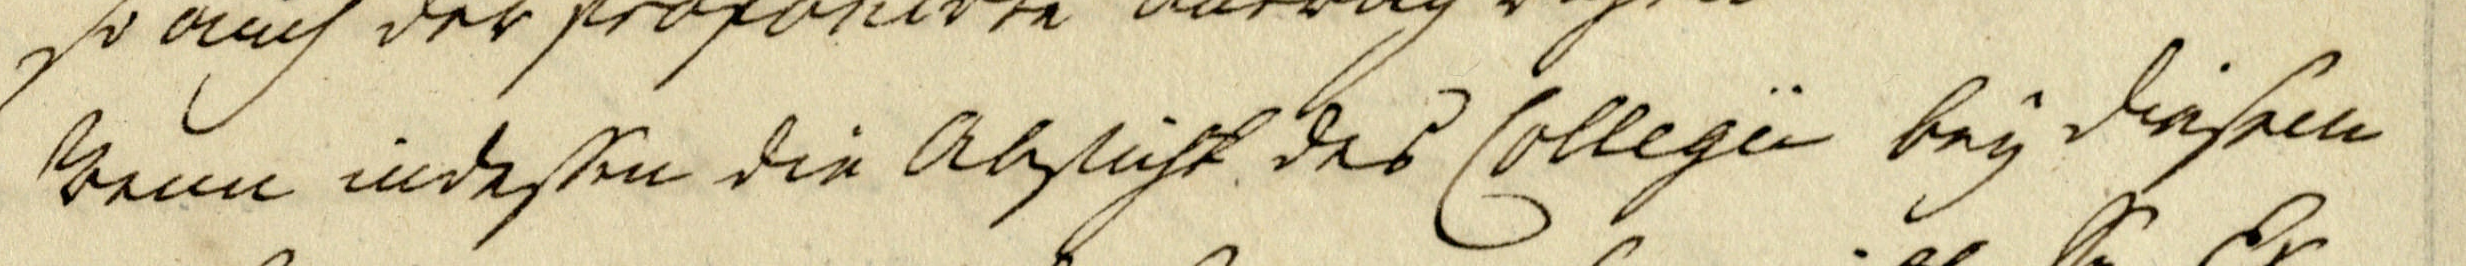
Wenn indessen die Absicht des Collegii beÿ diesem
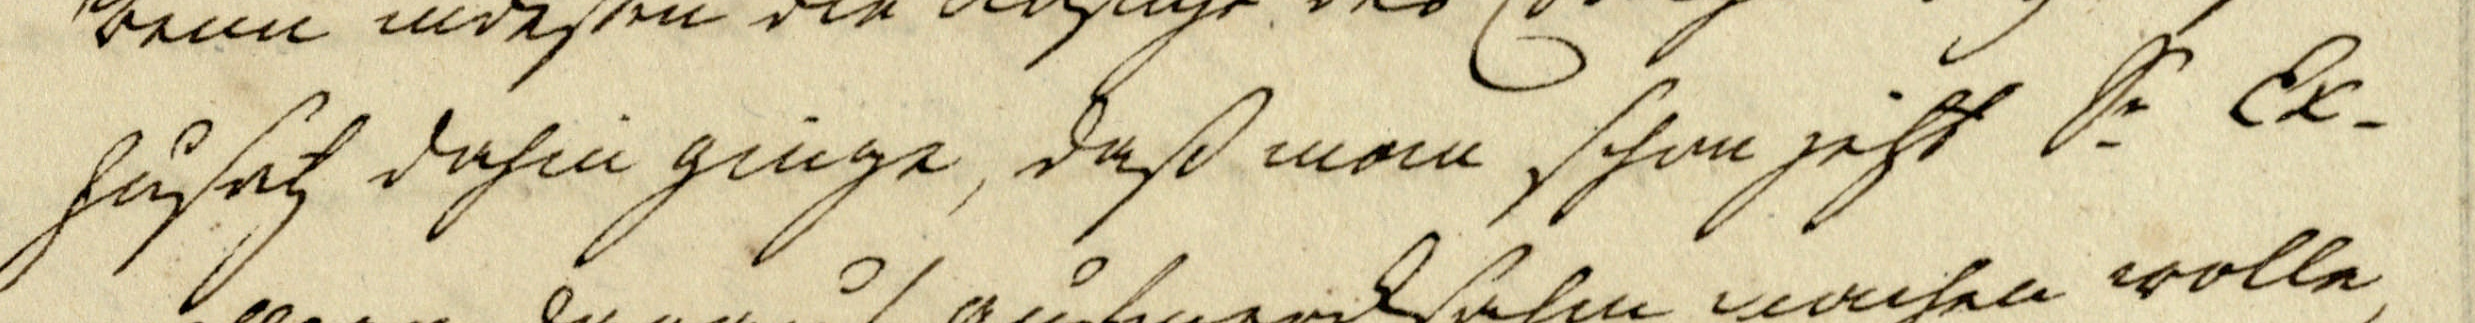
Zusatz dahin ginge, daß man schon jetzt Sr Ex¬
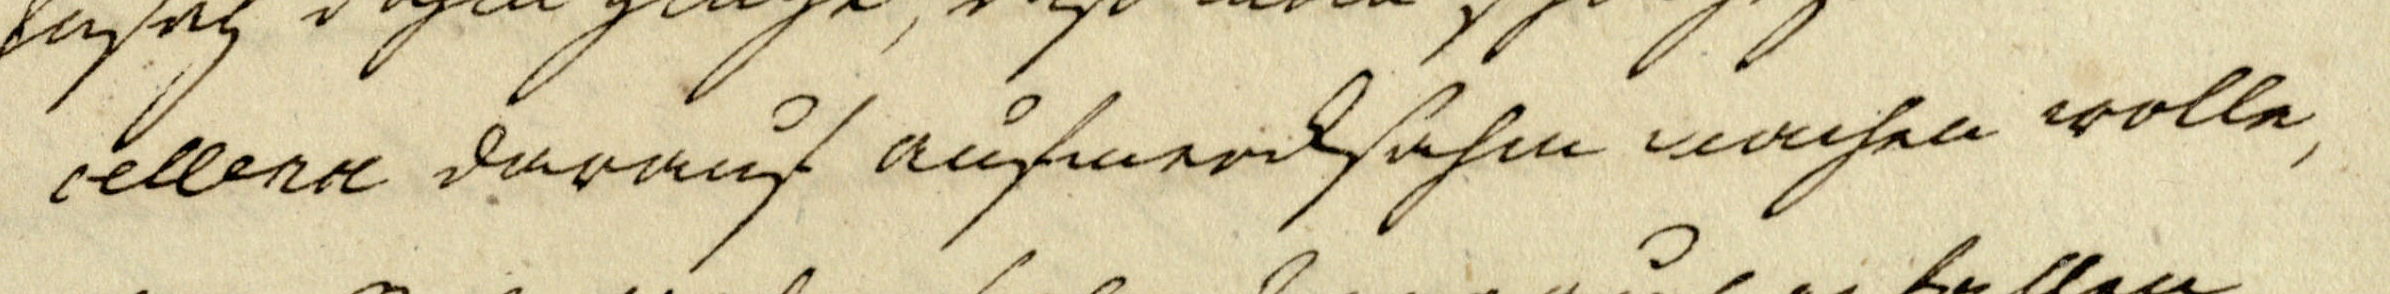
cellence darauf aufmerksahm machen wolle,
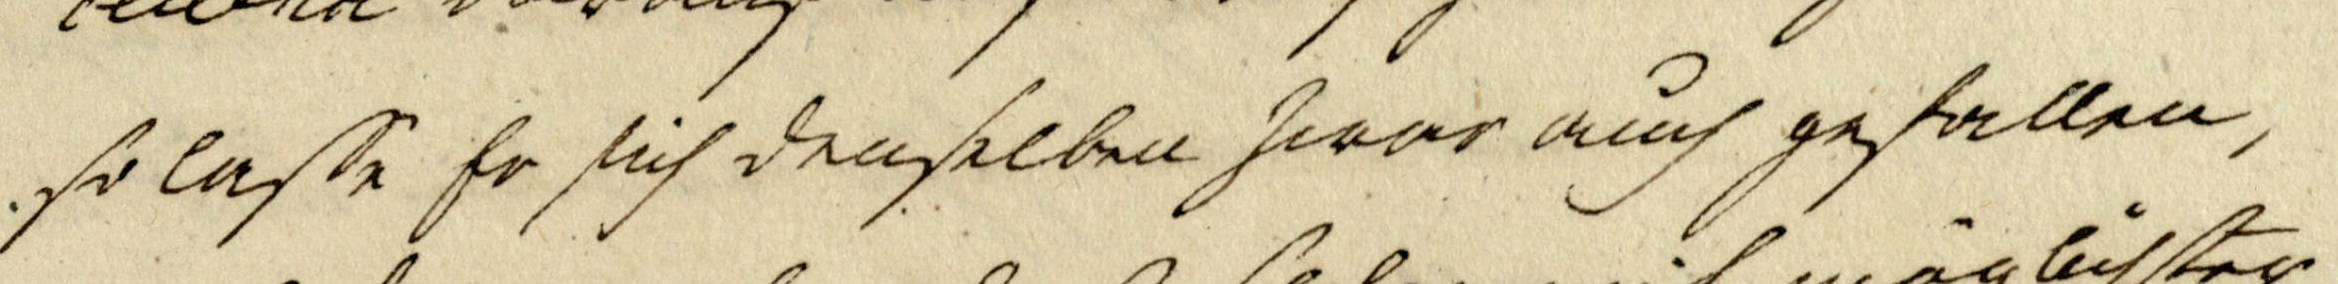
so lasse Er sich denselben zwar auch gefallen,
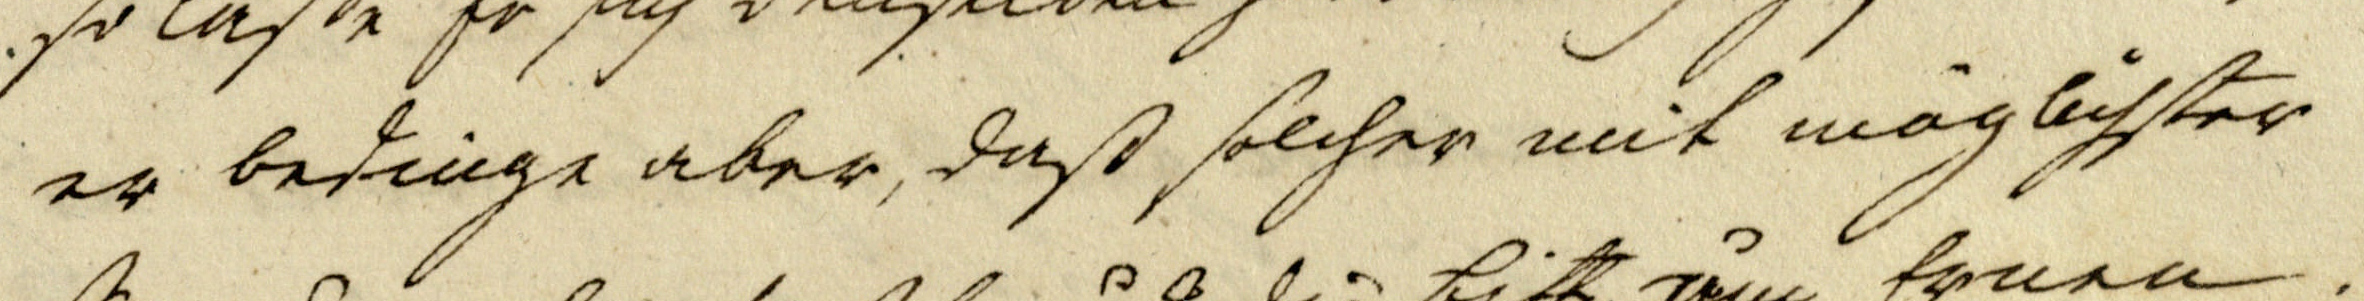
er bedinge aber, daß solcher mit möglichster
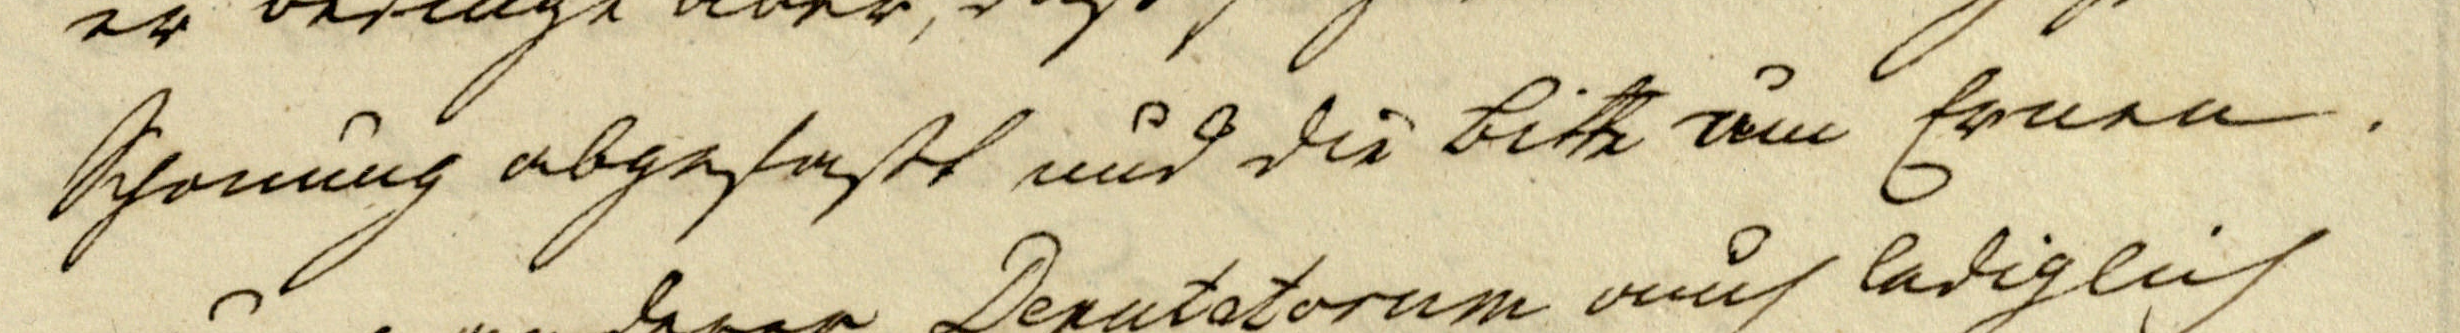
Schonung abgefaßt und die Bitte um Ernen¬
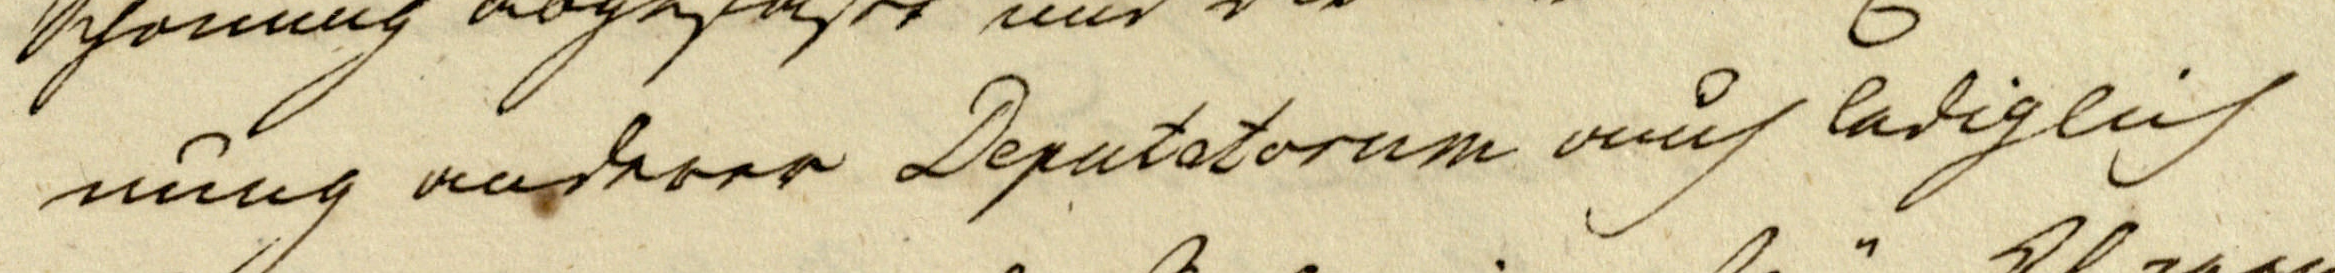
nung anderer Deputatorum auch lediglich
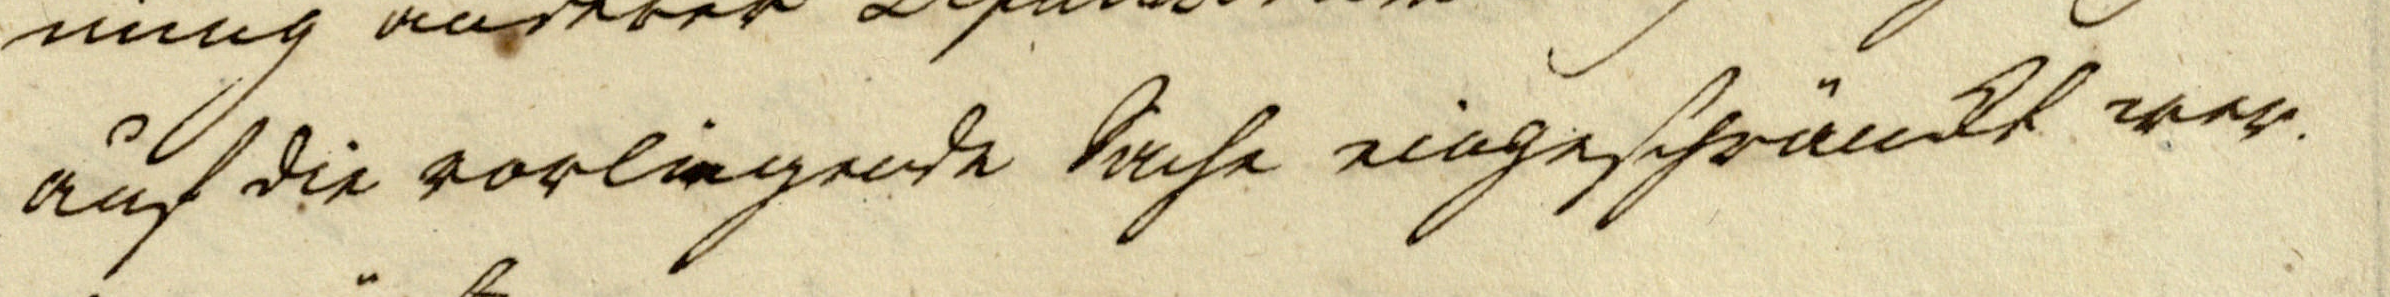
auf die vorliegende Sache eingeschränckt wer¬
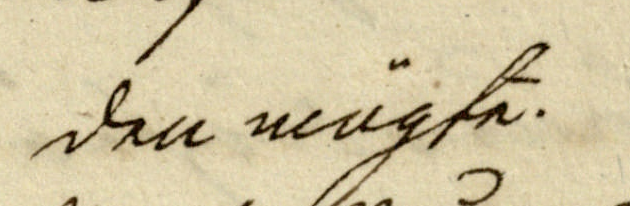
den mögte.
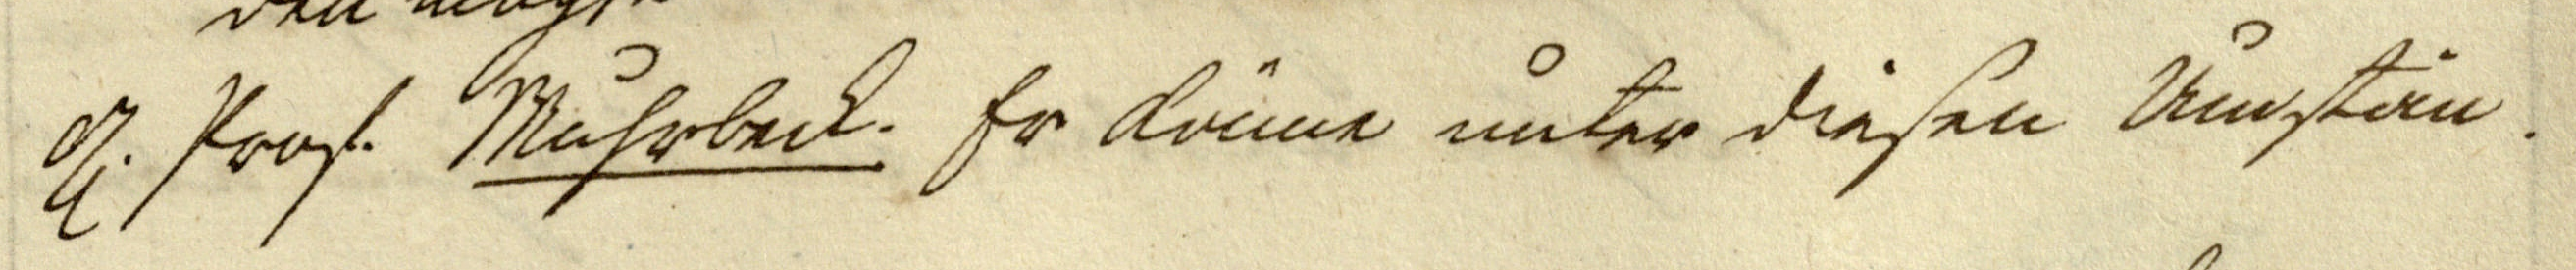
dh. Prof. Muhrbeck. Er könne unter diesen Umstän¬
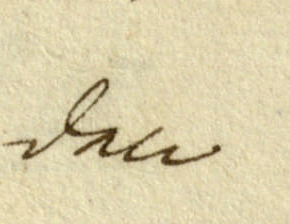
den
